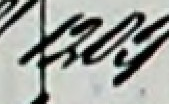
1209
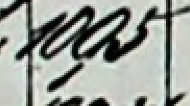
1005
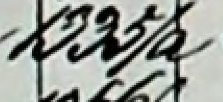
1335/a
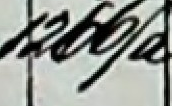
1266/a
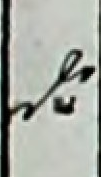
do
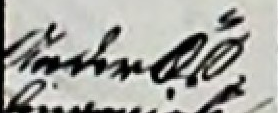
An der Ös„
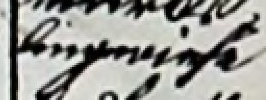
lingwiese
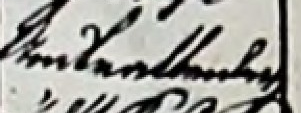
Am Reattenbach
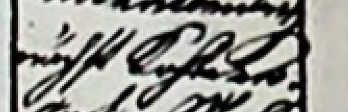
wächst Kohnen.
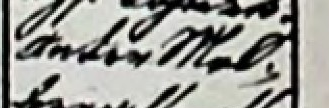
Anton Mars„
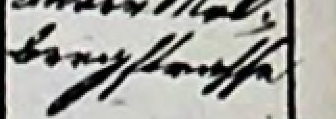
bergstraffe
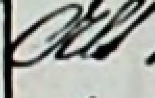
Alt
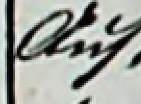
Aus„
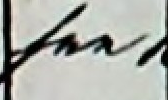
see
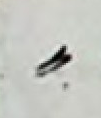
„
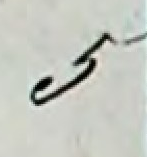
5
